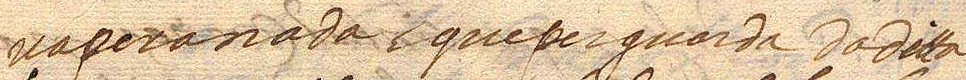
ua pera nada E que por guarda da ditta
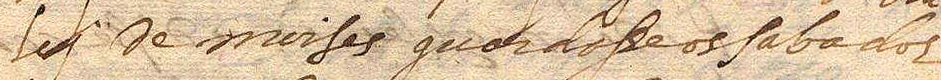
lej de moises guardasse os sabados
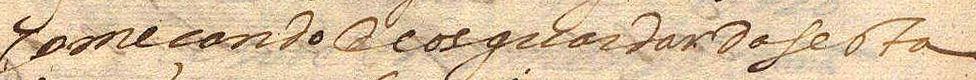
começando de os guardar da sesta
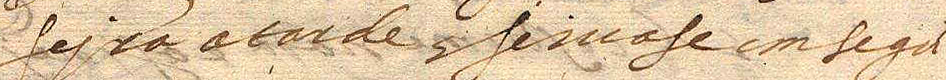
fejra a tarde E jeiuase em segū
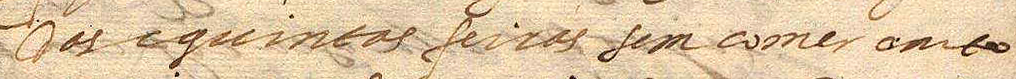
das e quintas feiras sem comer em to
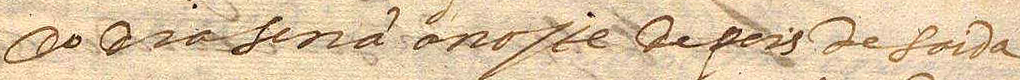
do dia senā a nojte depois de saida
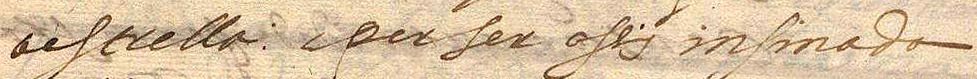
a estrella: e por ser assy insinada
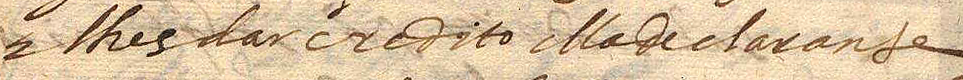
e lhes dar credito ella declarante
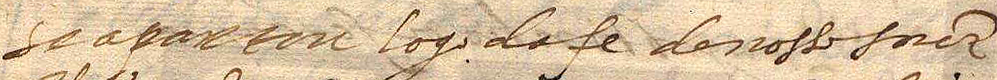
se apartou logo da fe de nosso snor̄
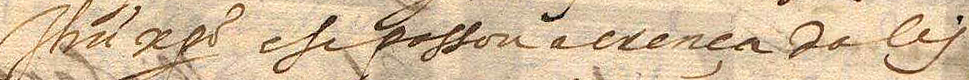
Jhū xpō e se passou a crença da lej
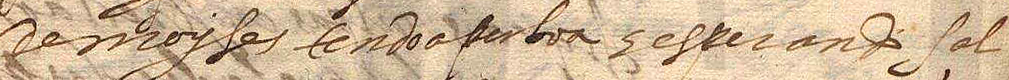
de moyses tendoa por boa E esperando sal
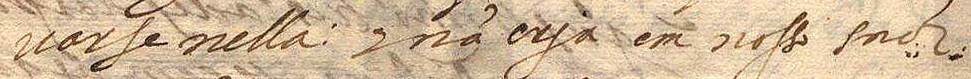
uarse nella: E nā crja em nosso snor̄
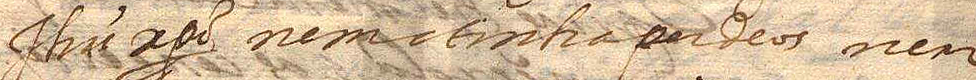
Jhū xpō nem o tinha por deos nem
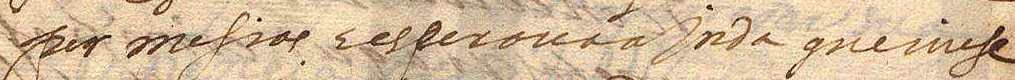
por messias E esperaua ajnda que uiese
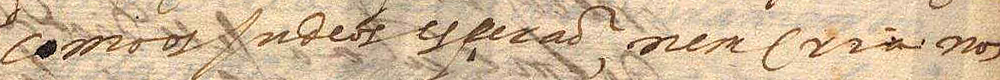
como os judeos esperaõ, nem cria nos
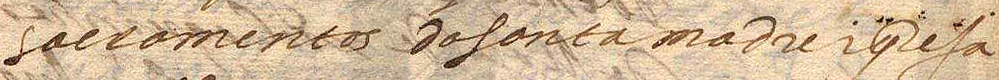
sacramentos da santa madre igreja
